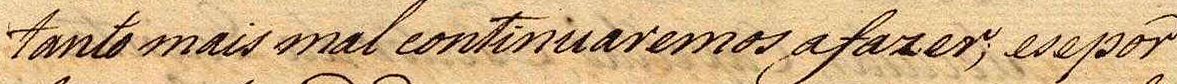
tanto mais mal continuaremos a fazer; e se por
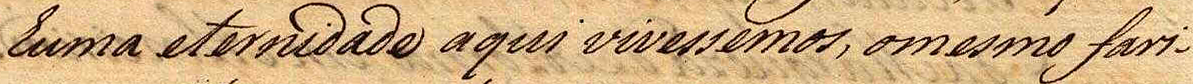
huma eternidade aqui vivessemos, o mesmo fari
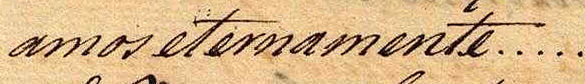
amos eternamente.....
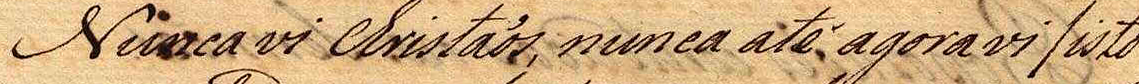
Nunca vi christaõs, nunca até agora vi / isto
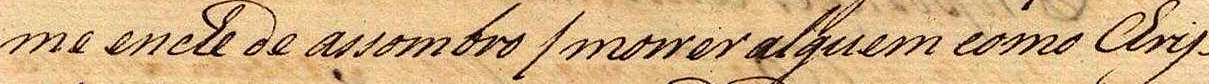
me enche de assombro / morrer alguem como Chris
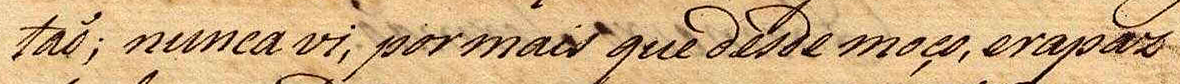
taõ; nunca vi, por mais que desde moço, e rapaz
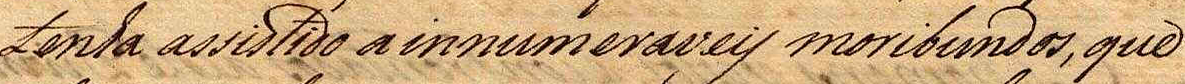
tenha assistido a innumeraveis moribundos, que
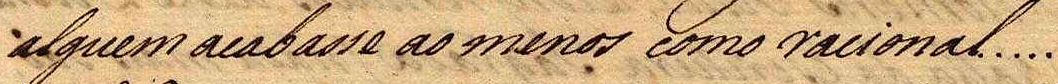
alguem acabasse ao menos como racional.....
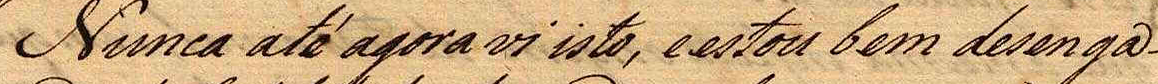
Nunca até agora vi isto, e estou bem desenga
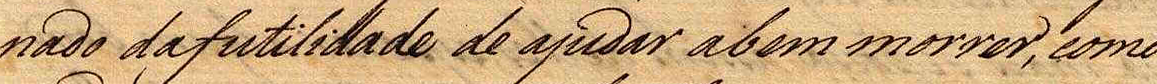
nado da futilidade de ajudar a bem morrer, como
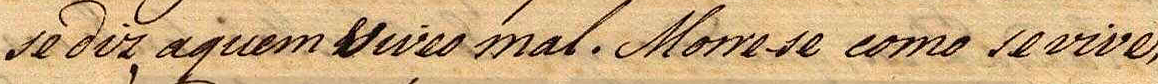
se diz a quem viveo mal. Morre-se como se vive,
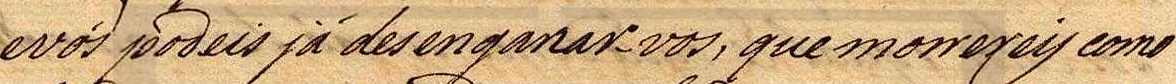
e vós podeis já desenganar-vos, que morrereis como
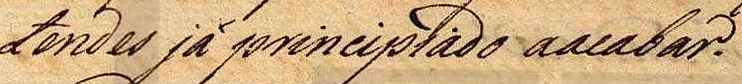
tendes já principiado a acabar.
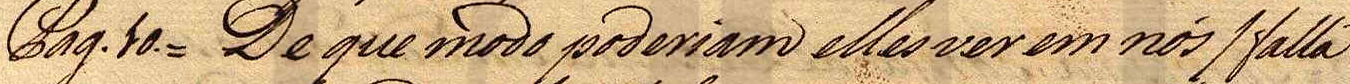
Pag.10. = De que modo poderiam elles ver em nós / falla
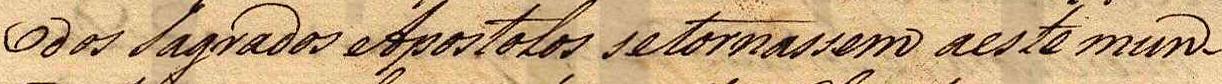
dos Sagrados ApostoLos se tornassem a este mun
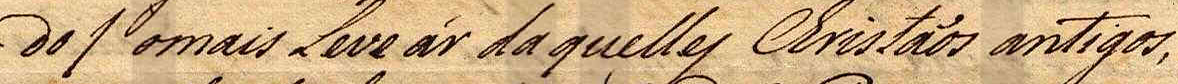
do / o mais Leve ár daquelles Christãos antigos,
